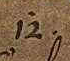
12
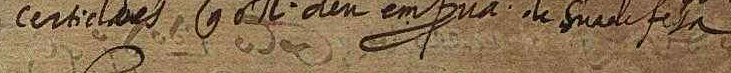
certidoẽs q̄ o R. deu em ꝓua de sua defesa
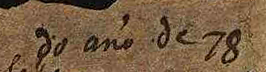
do an̄o de 78
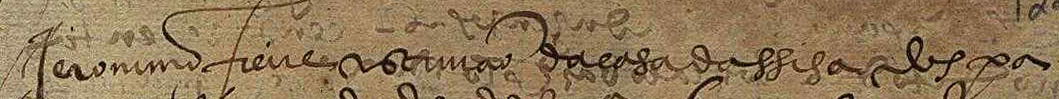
Jeronimo freire escriuaõ da casa da ssisa dos pa
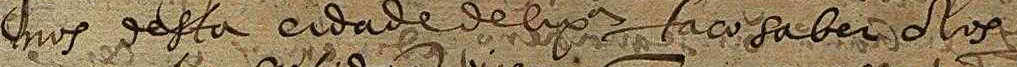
nos desta cidade de lixa faço saber Aos
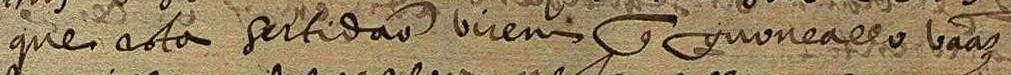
que esta sertidão virem q̄ guonçallo vaaz
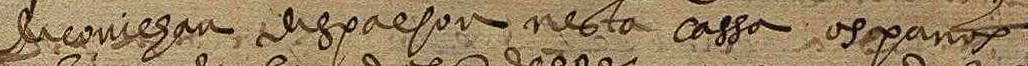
de couilhan despachou nesta cassa os panos
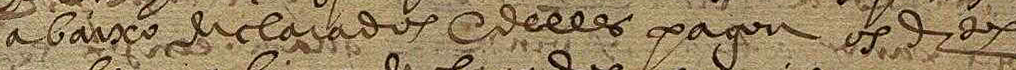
abaixo declarados e delles pagou os drtos
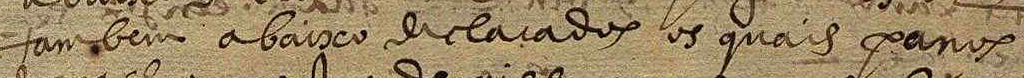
tambem abaixo declarados os quais panos
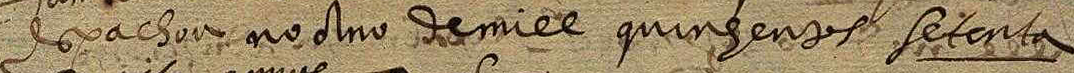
despachou no Ano de mill quinhentos setenta
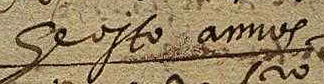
he ojto annos
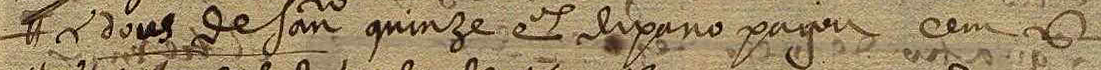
item ē dous de Janro quinze cos de pano pagou cem rs
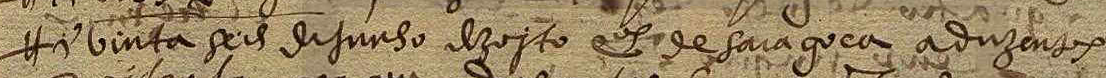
item ē vinta seis de Junho dezojto cos de saragoça a duzentos
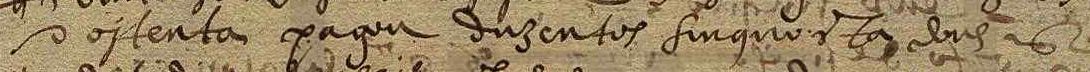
e ojtenta pagou duzentos sinquoēta dous rs
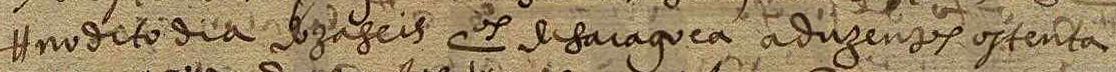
item no dito dia dezaseis cos de saragoça a duzentos ojtenta
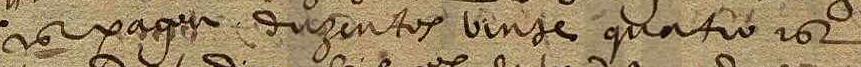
rs pagou duzentos vinte quatro rs
